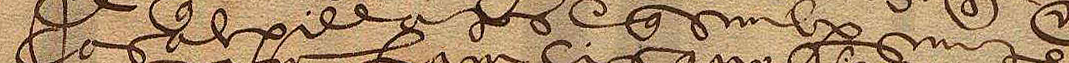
casa de pillatos e q̄ sendo ꝑsemte
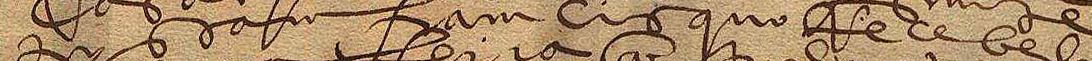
trystam framcisquo Recebedor
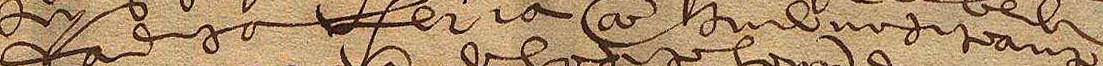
da dita feira c̄oteudo no dito auto
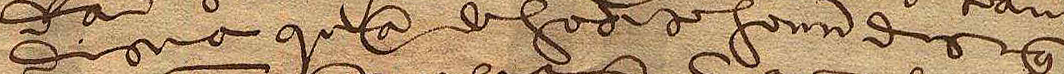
disera quādo ho dito homē dise q̄
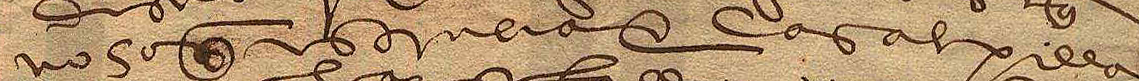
noso s̄r estjuera ē casa de pilla
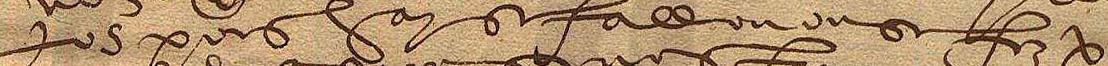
tos pois haj se fallou ou se fez ꝟ
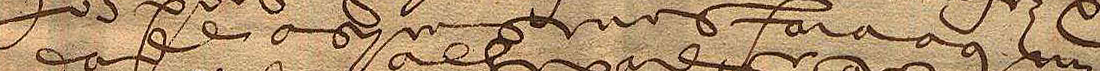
dade asym se uos fara aquy
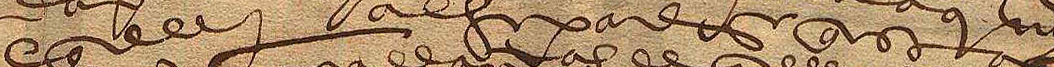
e q̄ elle ta lhe parese q̄ estas
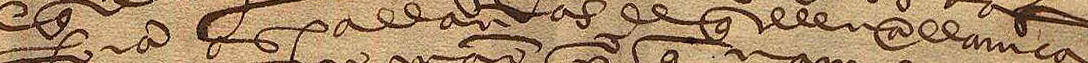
forā as pallauras de q̄ elle nā llamça
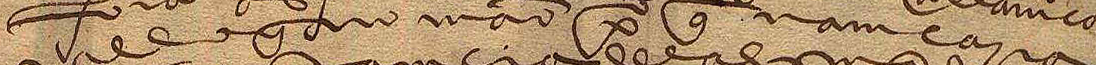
ra lloguo mão p̄oq̄ nam cajra
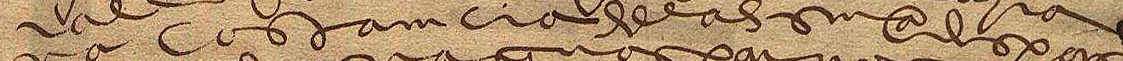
na costamcia dellas senā despois
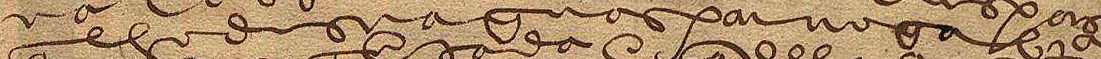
q̄ lho desera guaspar uogado ta
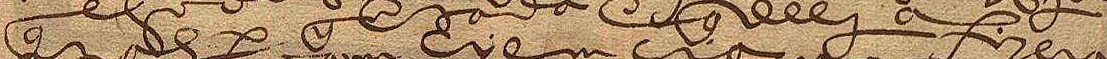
atras ꝑgūtada e q̄ elle ta fizera
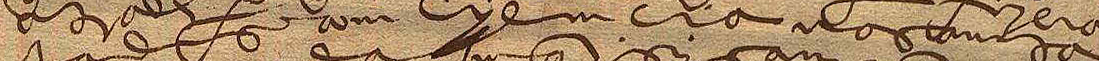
Ja diso comcyemcia na samta
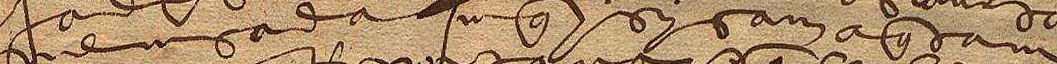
memsa da Jmq̄jsysam a q̄ tam
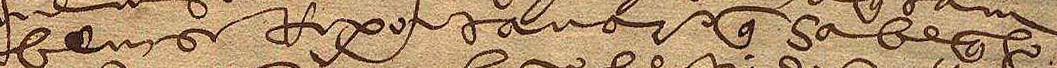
bem se Reportaua e q̄ sabe q̄ ho
